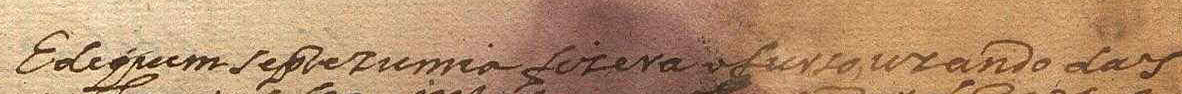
E de quem se prezumia fizera o furto uzando das
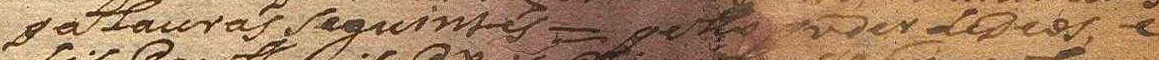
palauras seguinte = pello poder de Deos, e
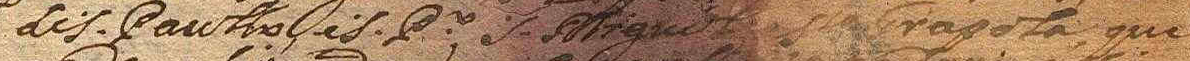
dis. Paullo e s. P.ro, S. Miguel sta Frapola, que
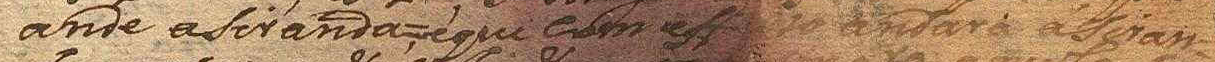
ande a siranda= e que com effeyto andara a siran
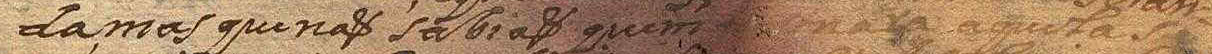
da, mas que naõ sabiaõ quem _sinara aqueLa se
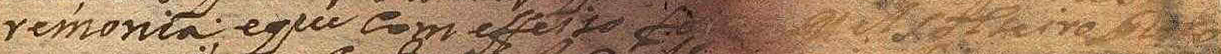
remonia; e que com effeito foraõ Mel solteiro pReso
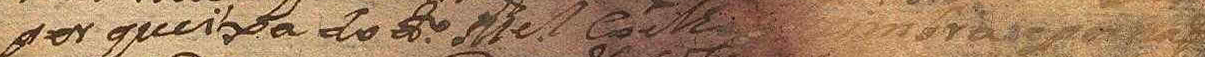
por queixa do d̄o Mel Coelh _zimbra por naõ
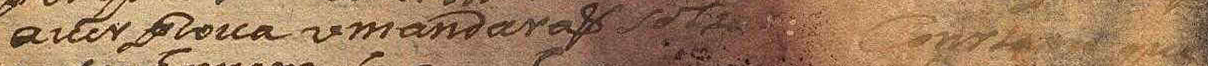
auer pRoua o mandaraõ solt _ consta_ que
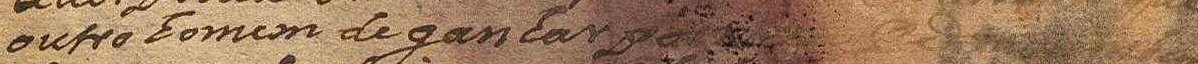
outro homem de ganhar p_ _______
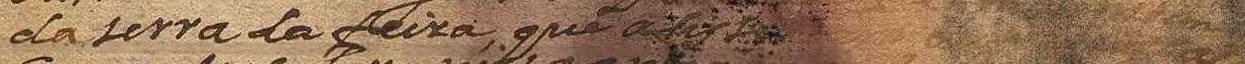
da terra da feira, que asist _______
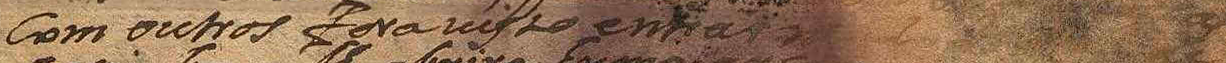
com outros fora uisto entrar n____ de
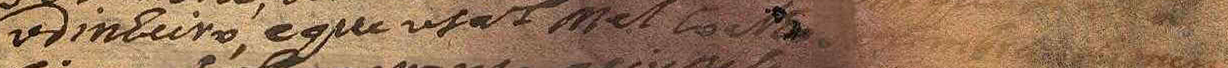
o dinheiro, e que u tal Mel Coelho Sezimbra _______
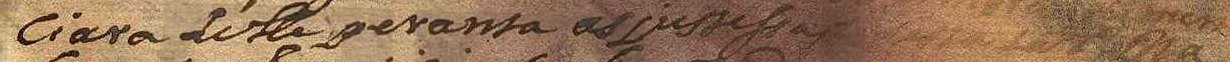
ciara delle peranta as justissas _____
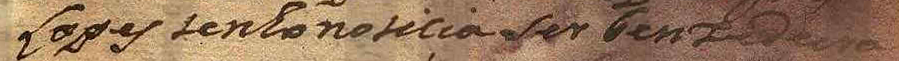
Lopes tenho noticia ser benzedeira
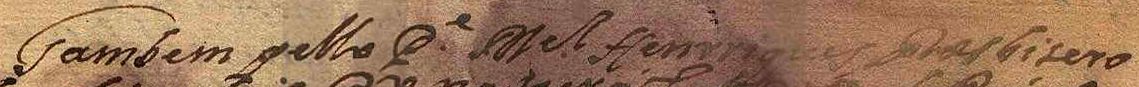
Tambem pello P.e Mel Henrriques pResbitero
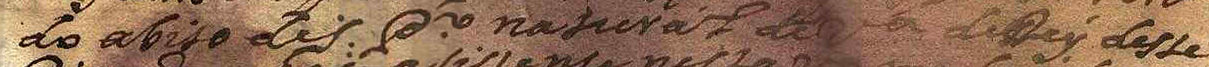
do abito de s. P.ro natural da Va de Rey deste
